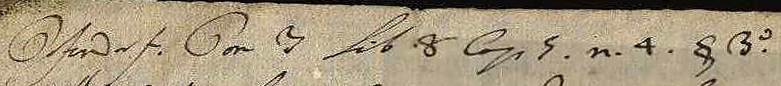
Pofendorf. Par 3 Lib. 8 Cap 5. n. 4. § 3.o
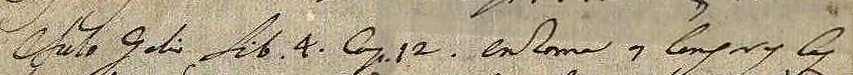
Aulo Galio Lib. 4. Cap. 12. en Roma os Censores Cas
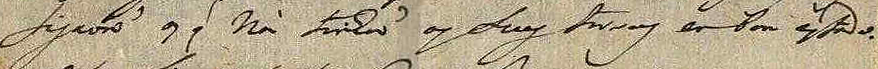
tigavaõ os q̄ nā tinhaõ as suas terras en bom estado.
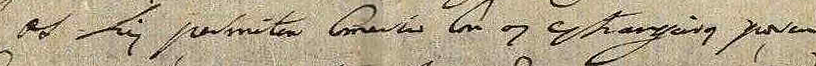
as Leis parmiten Comercio Con os estrangeiros porem
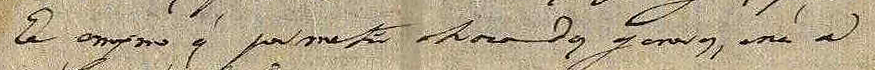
he o mesmo q̄ permetir a troca dos generos, e nā a
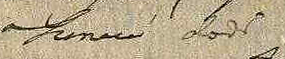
alienaçaõ do dro
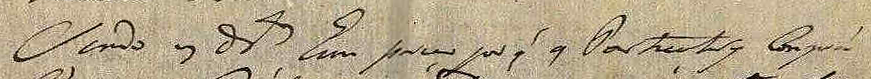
Sendo os drtos hua porção por q̄ os Particulares Compraõ
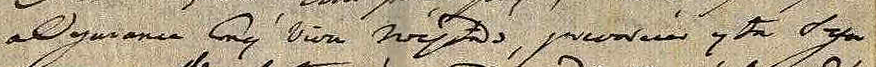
a segurança Com q̄ viven no estado, prevaricaõ esta segu
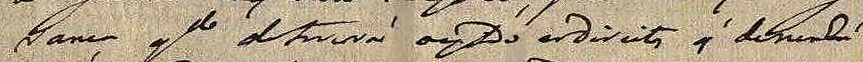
rança qdo detiveraõ o estado os direitos q̄ de nenhū
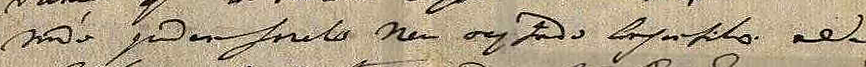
modo podem fazelo nem o estado Consentilo: e se
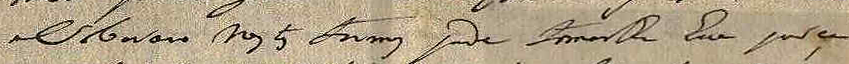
o Soberano nestes termos pode tomarlhe hua porçaõ
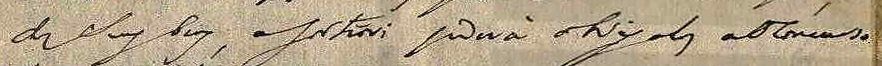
dos Seus bens, a fortiori poderá oobrigalos ao concurso
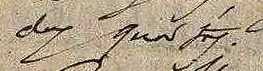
dos quartos.
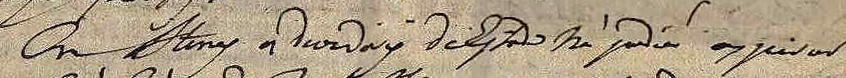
En Atenas os devedores de Estado nā podiā aspirar
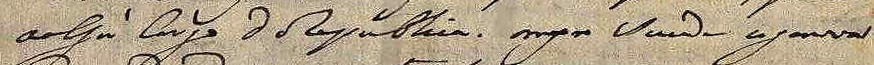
a algū Cargo da Republica. o mesmo sucede en genova
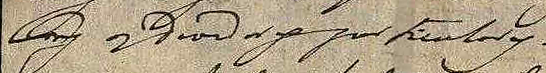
Com os devedores particulares.
